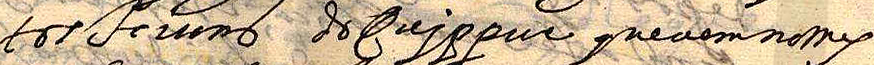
tos Ieiuns do Qujppur que uem no mes
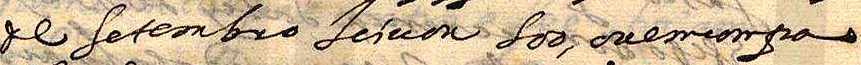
de Setembro Ieiuou soo, ou em compa
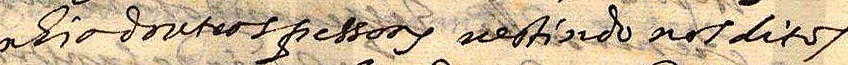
nhia doutras pessoas uestindo nos ditos
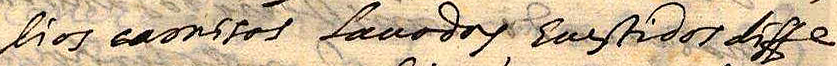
dias camisas lauadas, E uestidos diffe
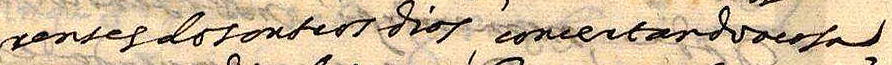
resntes dos outros dias, concertando a casa
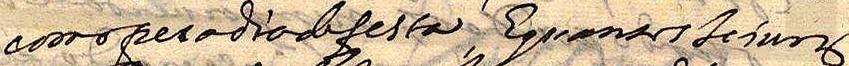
como pera dia de festa, E quantos Ieiuns
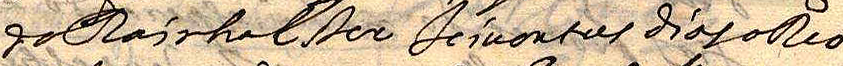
da Rainha Ester Ieiuou tres dias o Reo
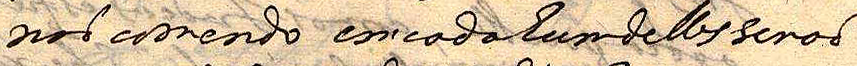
naõ comendo em cada hum delles senaõ
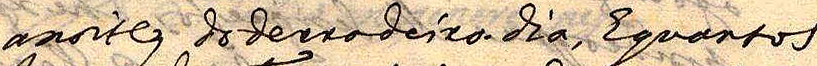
a noite do derradeiro dia, E quantos
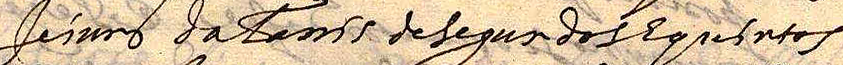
Jeiuns da Tanis de segundas E quintas
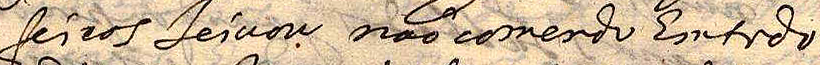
feiras Ieiuou naõ comento Em todo
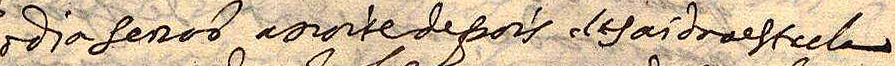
o dia senaõ a noite depois de saida a estrela
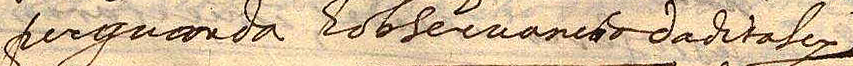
per guarda E obseruancia da dita Ley
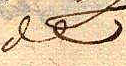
de
